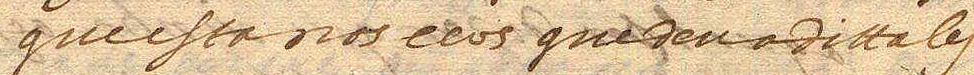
que esta nos ceos que deu a ditta lej
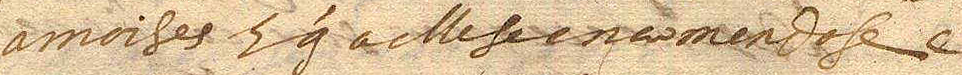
a moises E q̄ a elle se encomendase e
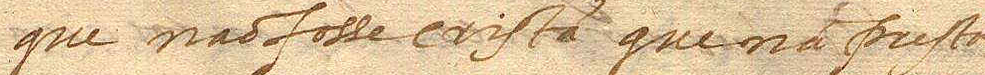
que naõ fosse cristã que nā presta
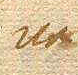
ua
